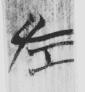左
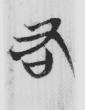右
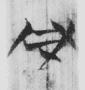凡
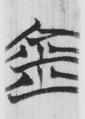金
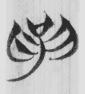革
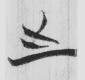之
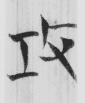攻
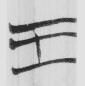王
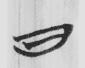日
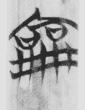侖
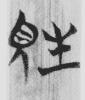{見生}
